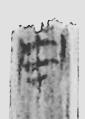甬
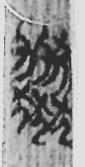{力犬力犬力犬}
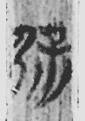保
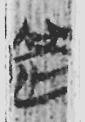罔
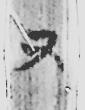又
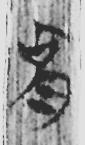{占肉}
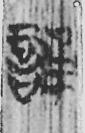誦
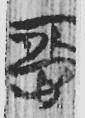{亙心}
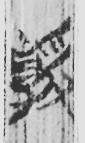靜
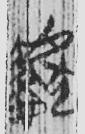獻
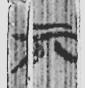亓
